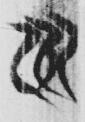州
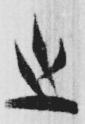之
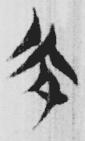帀（師）
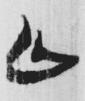㠯（以）
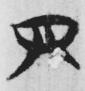四
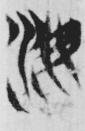○（海）
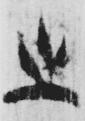之
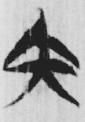內
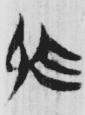於
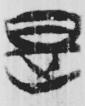是
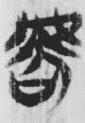唬（乎）
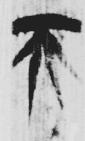天
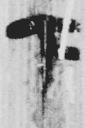下
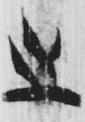之
